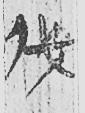伐
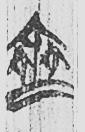齊
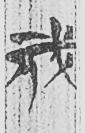戍
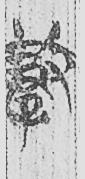{㱿子}
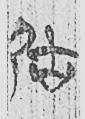居
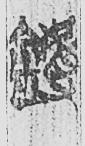{金虍且又}
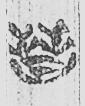晉
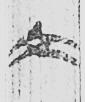文
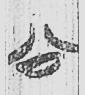公
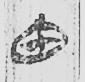囟
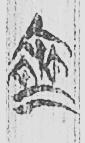齊
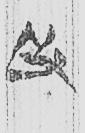及
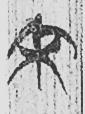宋
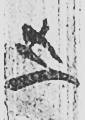之
